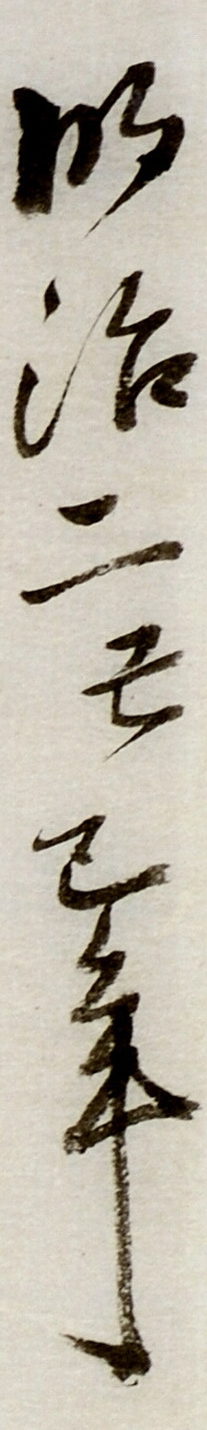明治二己巳年扣
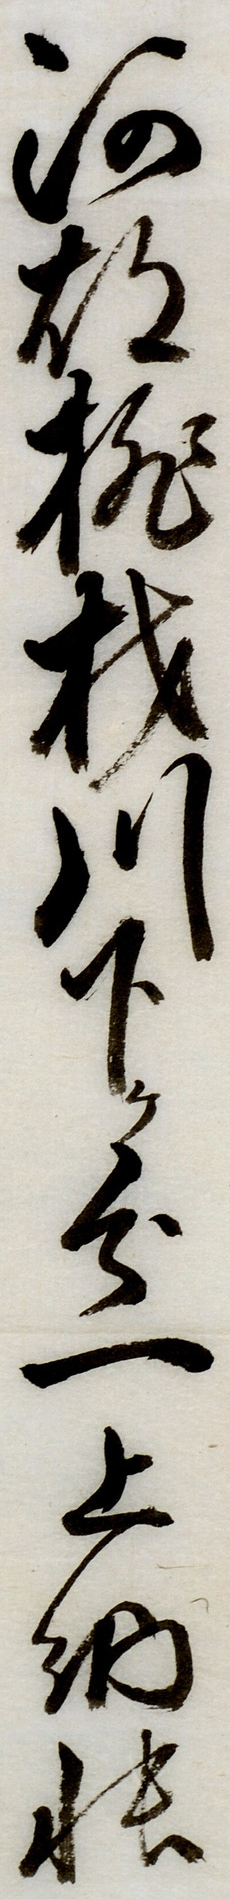河胡桃材川下ケ分一上納帳
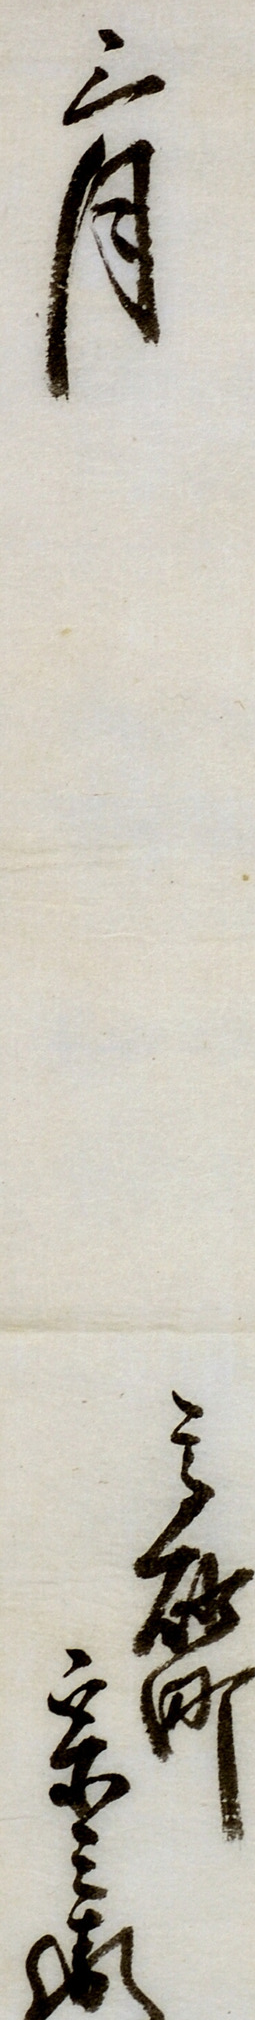三月高砂町
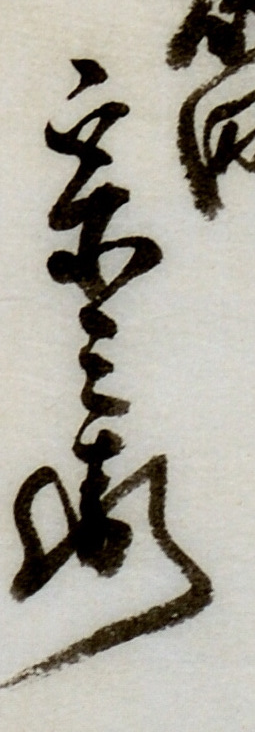宗兵衛
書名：河胡桃材川下ゲ分一上納帳
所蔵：伊那市立高遠町図書館・合同会社AMANE
